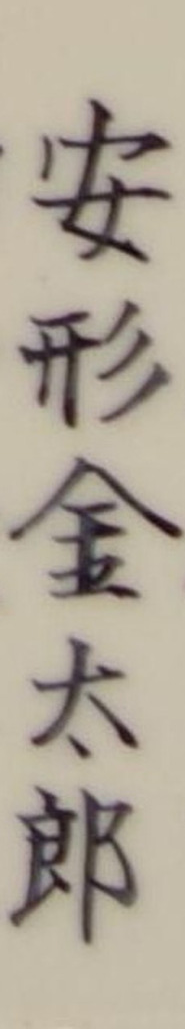安形金太郎
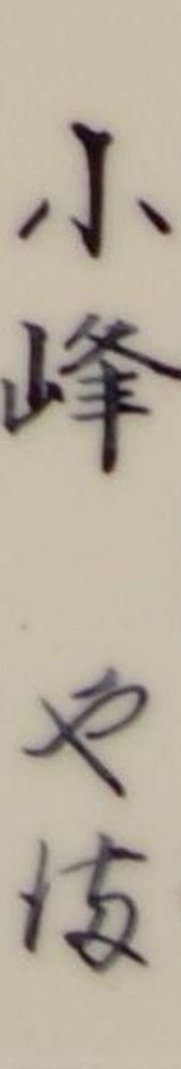小峰やま
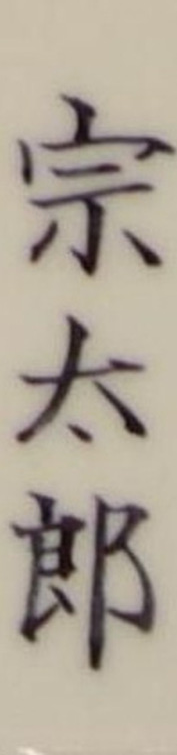宗太郎
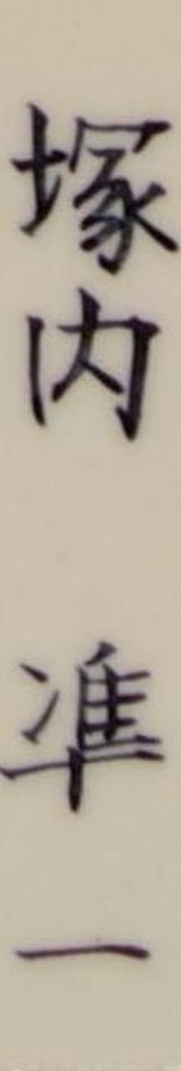塚内準一
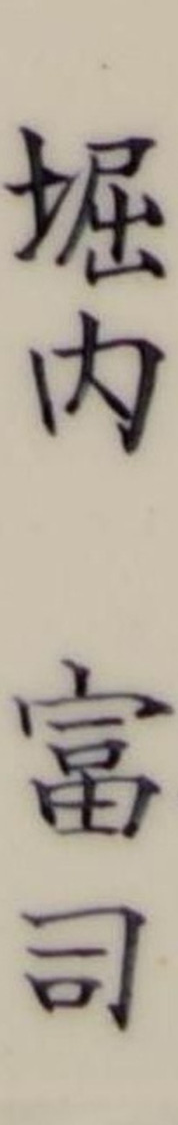堀内富司
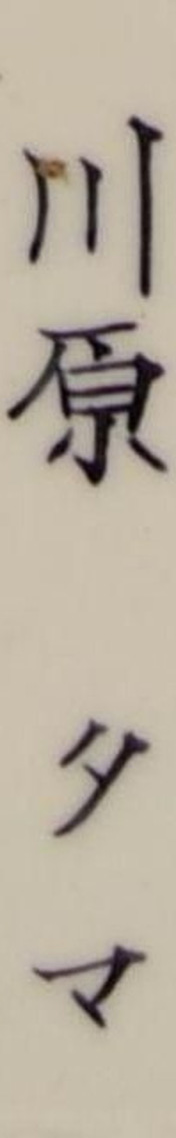川原タマ
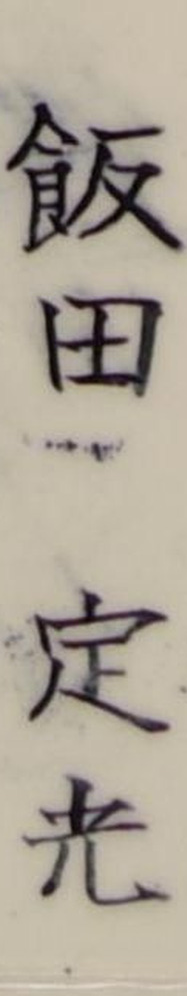飯田定光
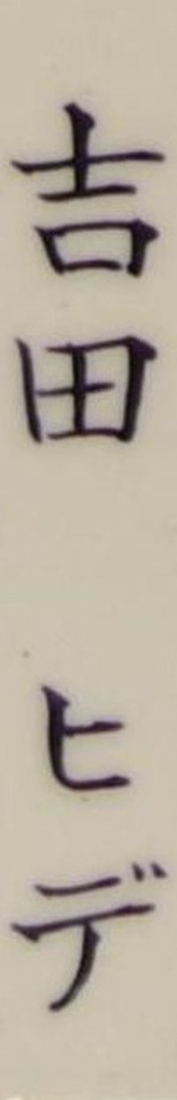吉田ヒデ
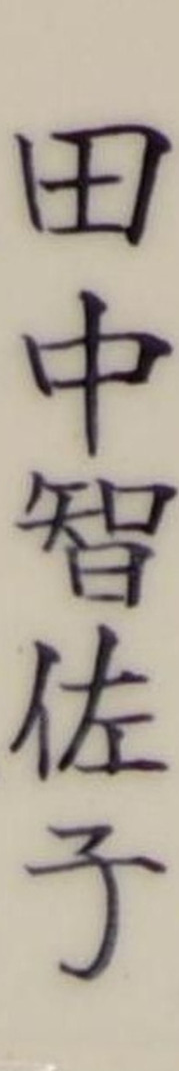田中智佐子
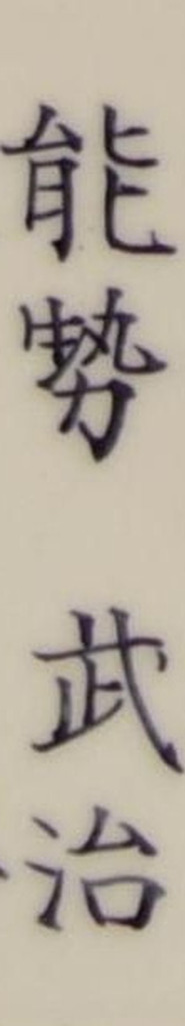能勢武治
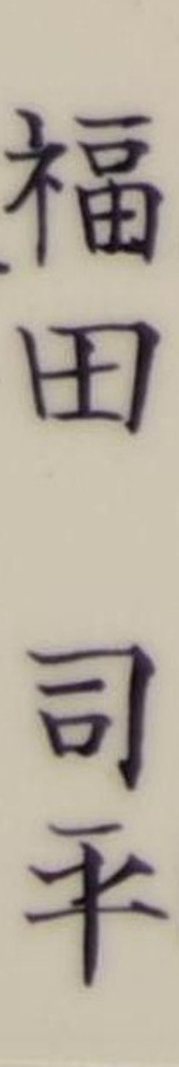福田司平
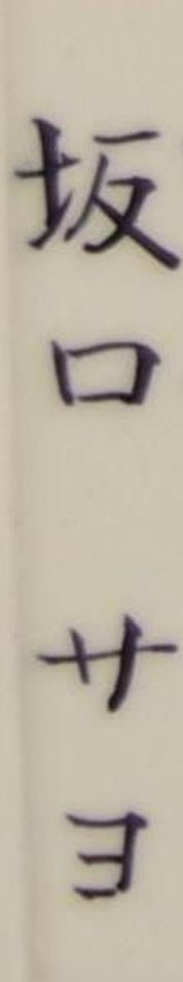坂口サヨ

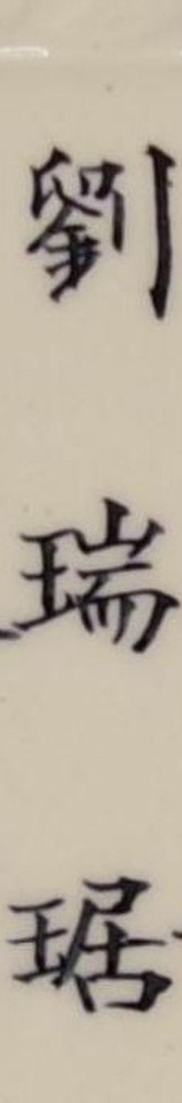劉瑞居
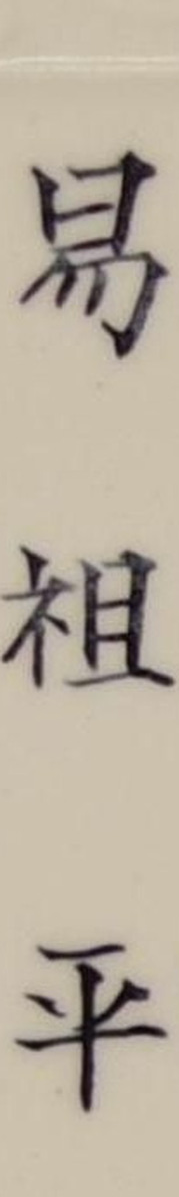易粗平
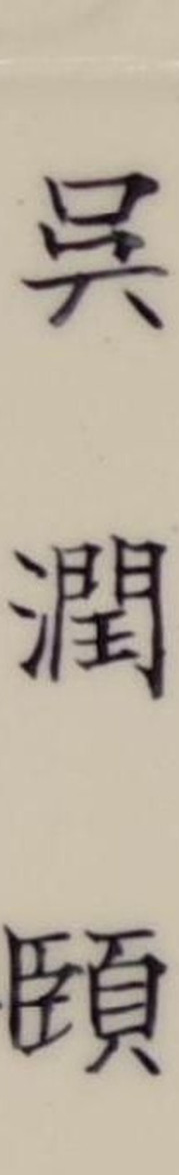呉蘊頤
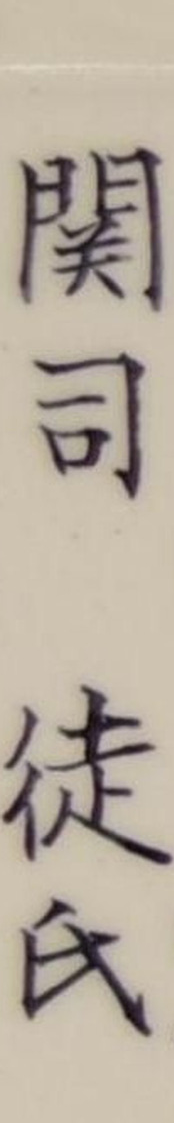関司徒氏
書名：M~S
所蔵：高野山金剛峯寺
